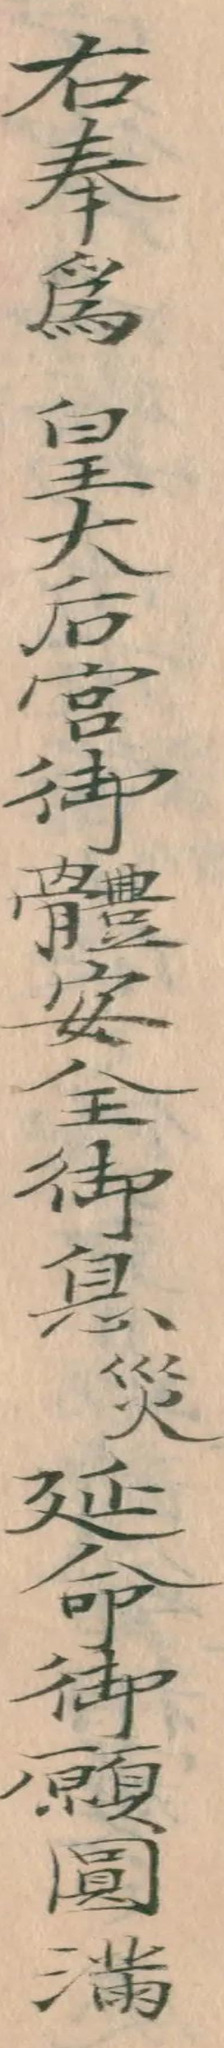右奉爲皇大后御體安全御息災延命御願圓満
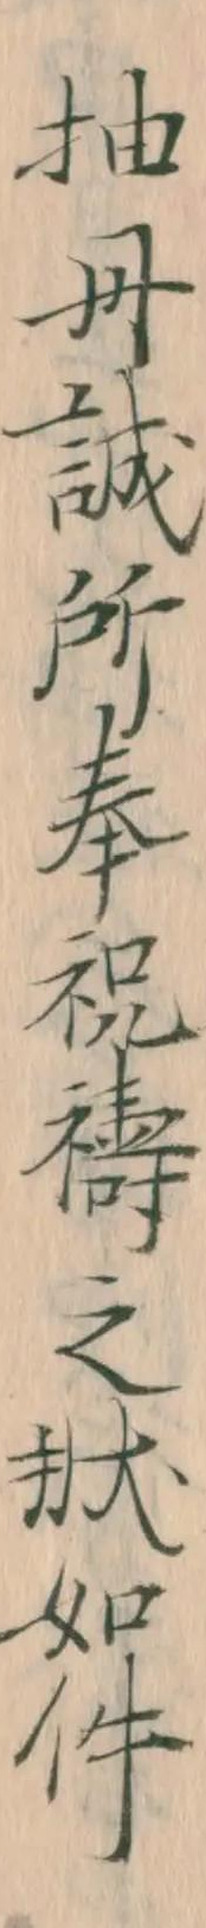抽丹誠所奉祝祷之状如件
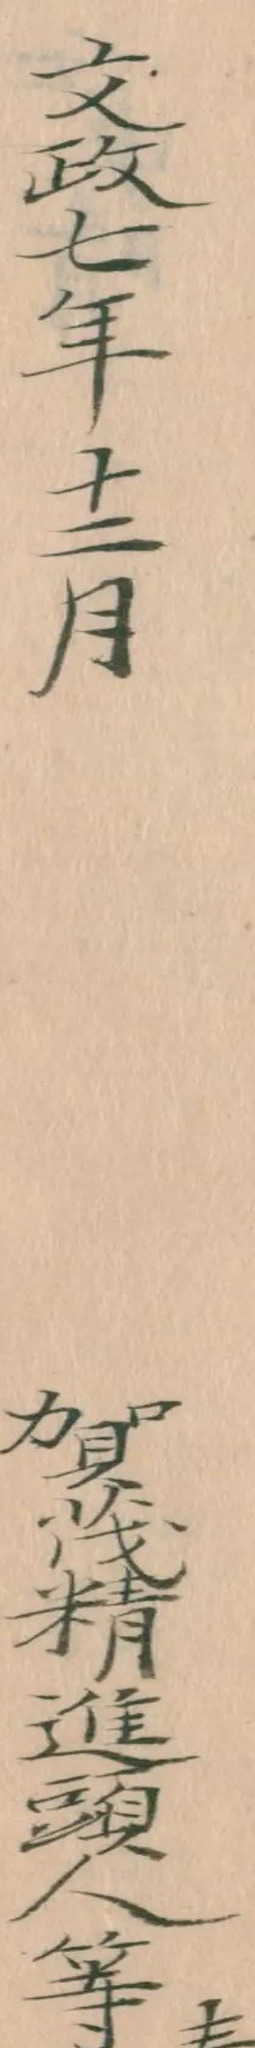文政七年十二月賀茂精進頭人等奉
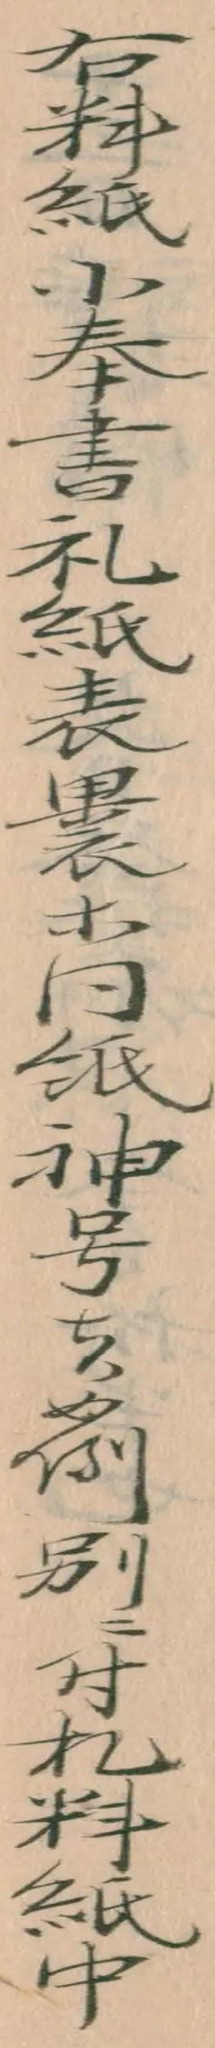右料紙小奉書礼紙表褁等同紙神号は如例別ニ付札料紙中
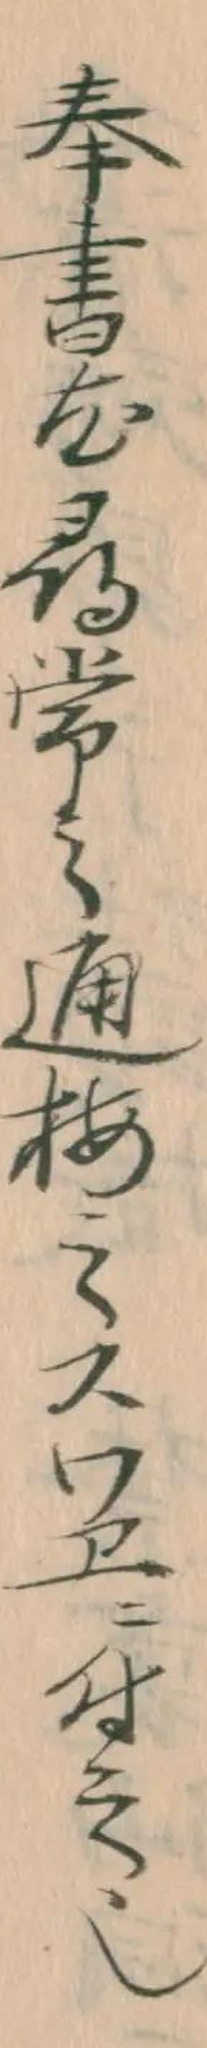奉書尤尋常之通梅之スワヱニ付之也
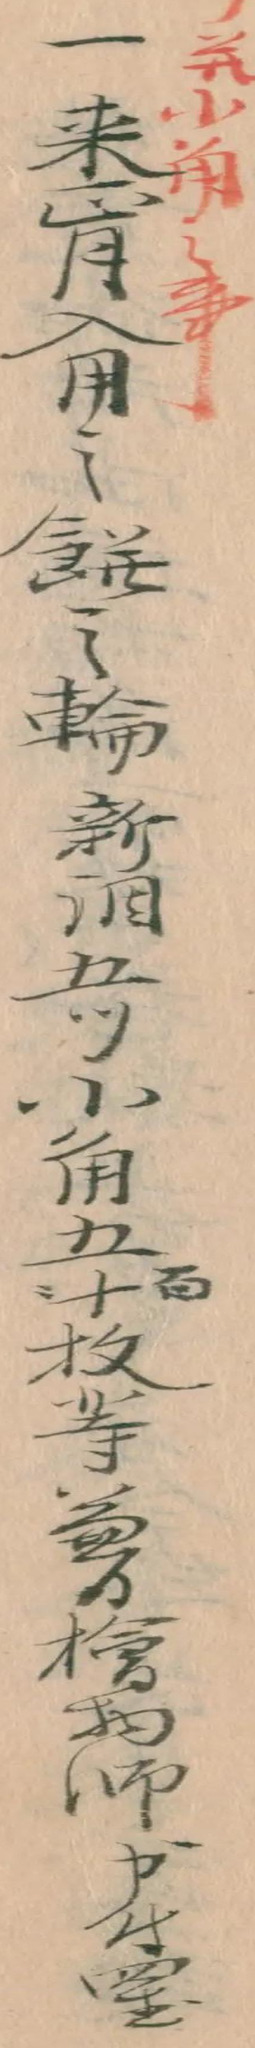一来正月入用之餅之輪新調五ツ小角五百枚等兼日檜物師へ申付置
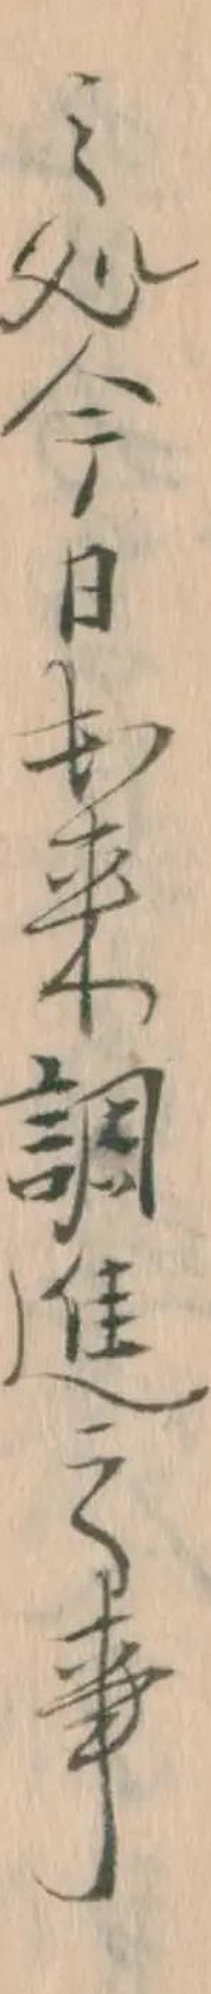之処今日出来調進之事
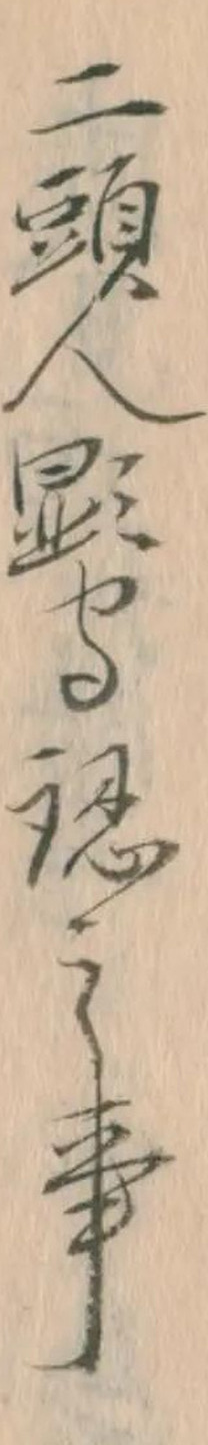二頭人顕守認之事
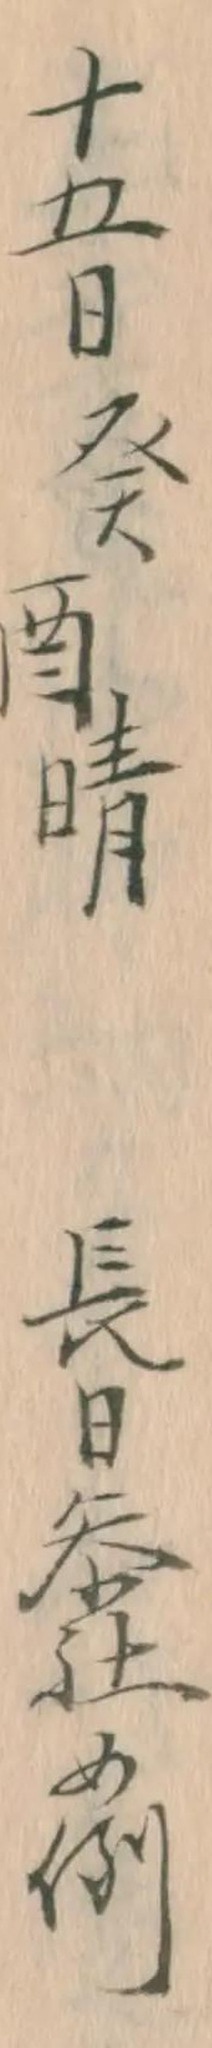十五日癸酉晴長日参社如例
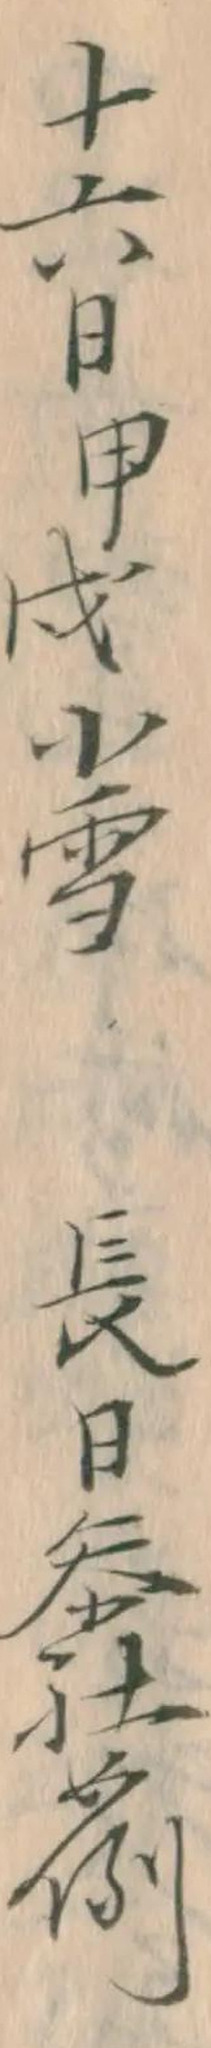十六日甲戌小雪長日参社如例
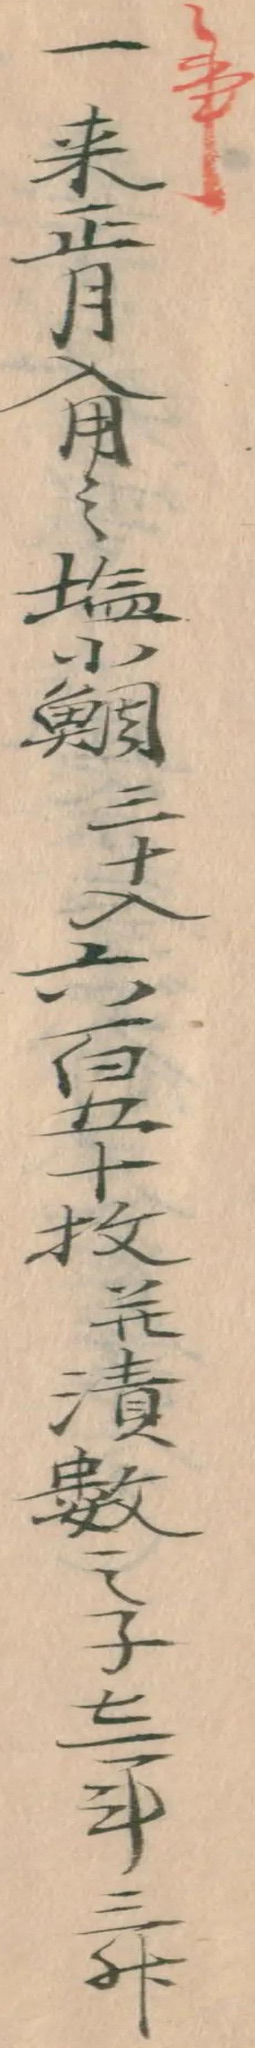一来正月入用之塩小鯛三十入六百五十枚并漬数之子壱斗三升
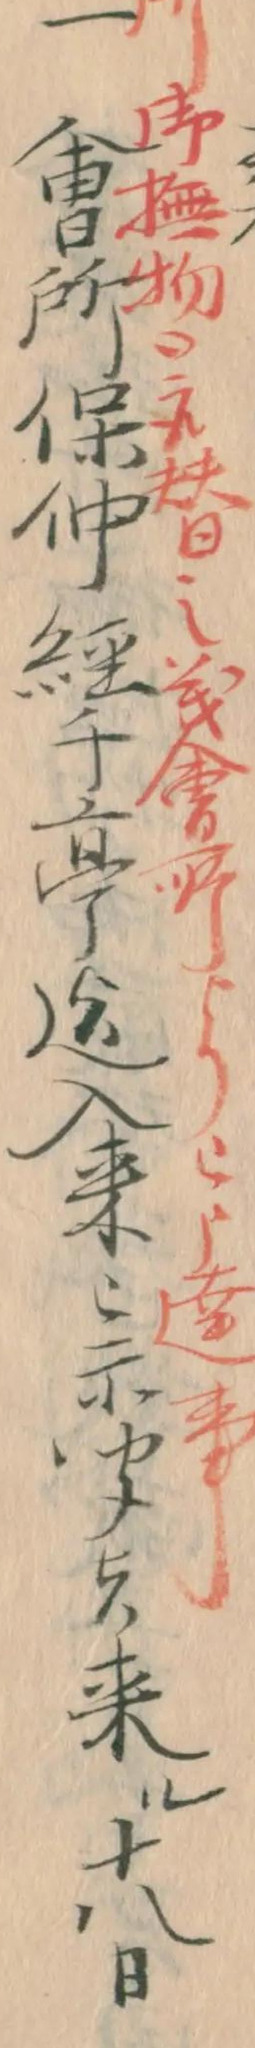一會所保仲経千亭迄入来被示聞は来ル十八日

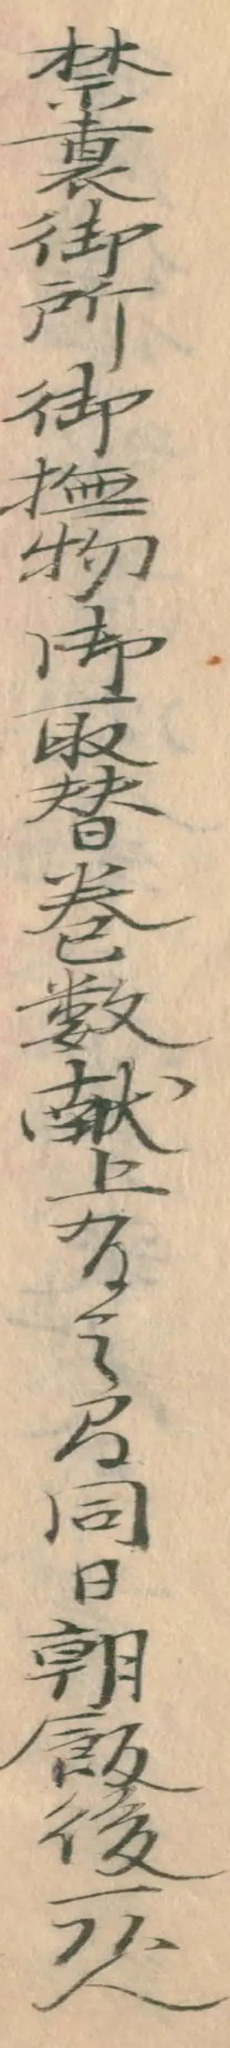禁裏御所御撫物御取替巻数献上有之間同日朝飯後一頭人
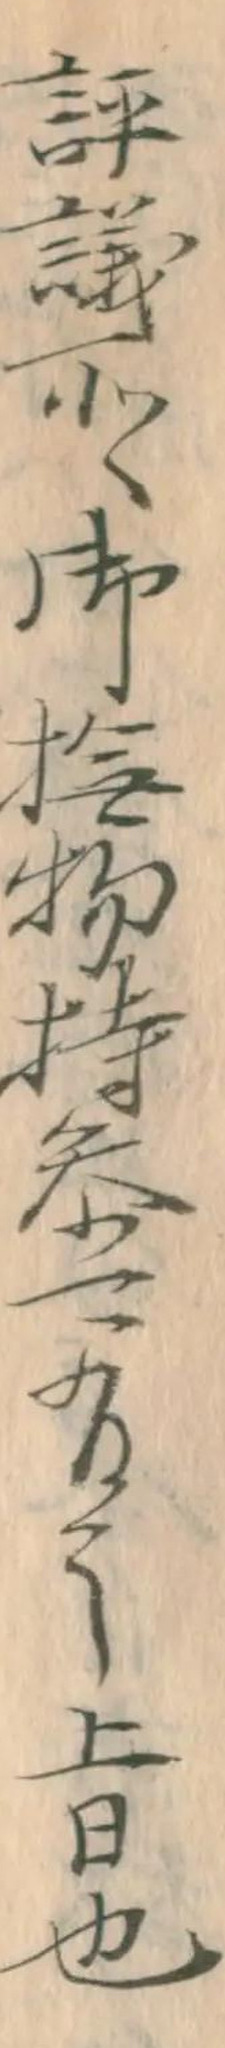評議所へ御撫物持参可有之旨也
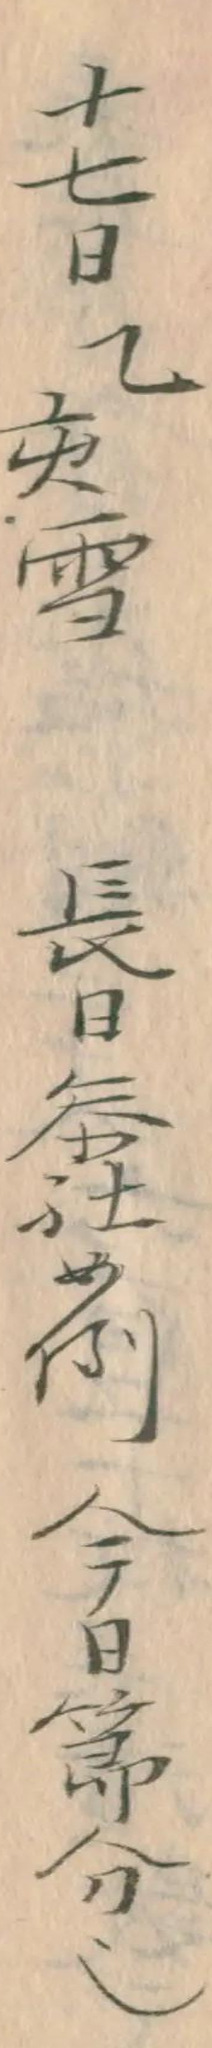十七日乙亥雪長日参社如例今日節分也
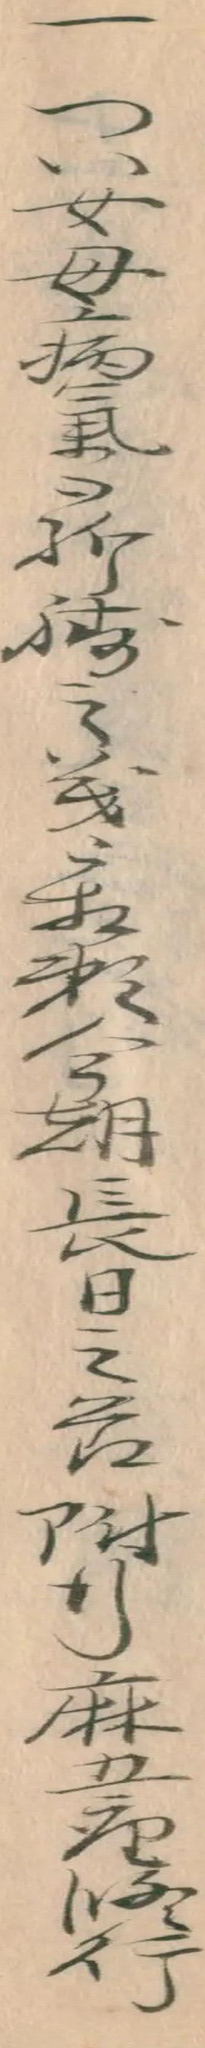一つい女母病氣御祈祷之義ニ相頼今朝長日之節附行麻五座修行
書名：賀茂社記録. 第74冊
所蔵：国立国会図書館 National Diet Library, JAPAN
